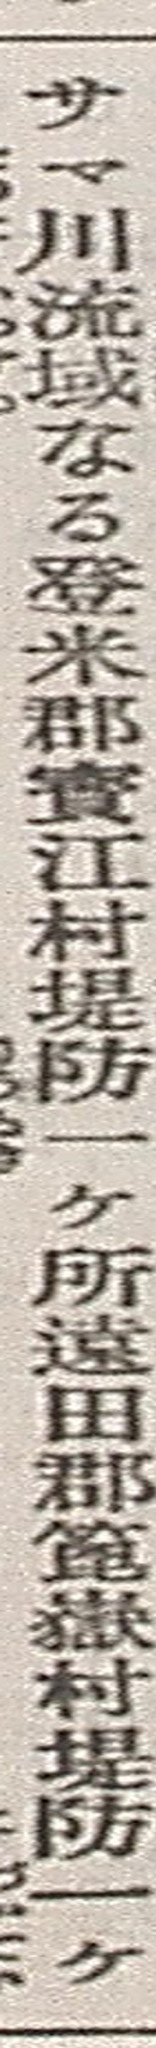サマ川流域なる登米郡寶江村堤防一ヶ所遠田郡箆嶽村堤防一ヶ
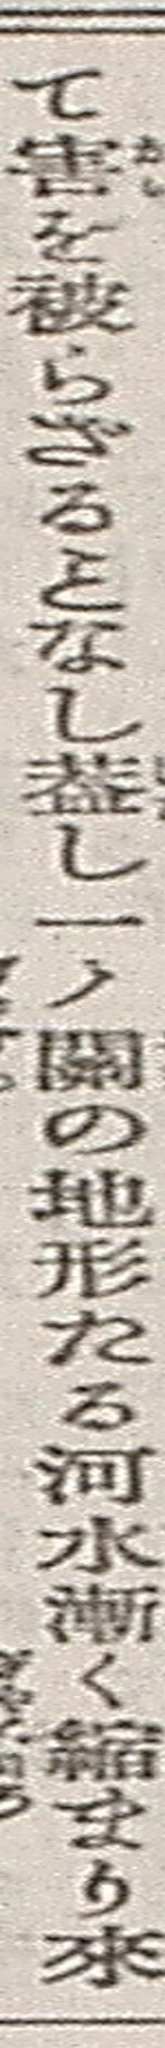て害を被らざることなし蓋し一ノ関の地形たる河水漸く縮まり来
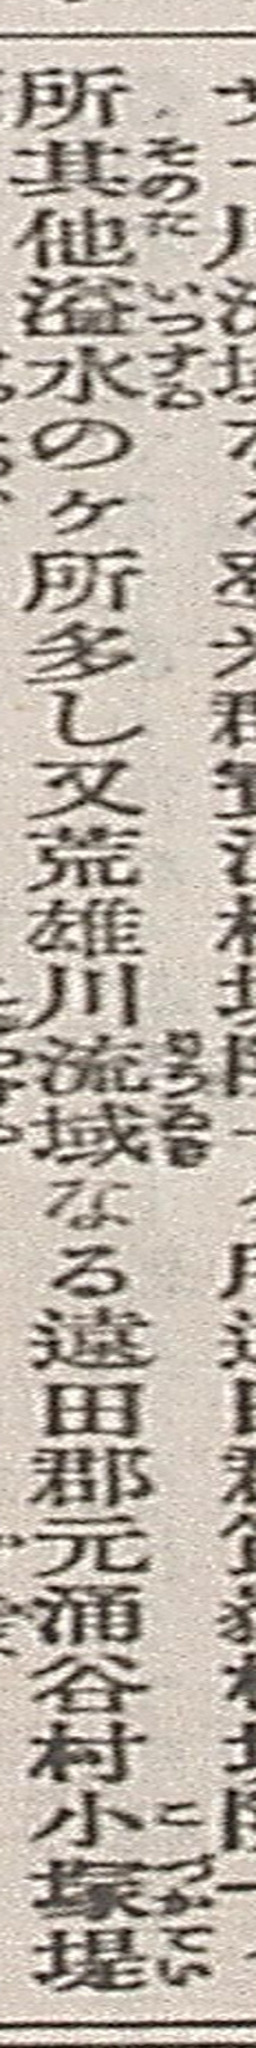所其他溢水のヶ所多し又荒雄川流域なる遠田郡元湧谷村小塚堤
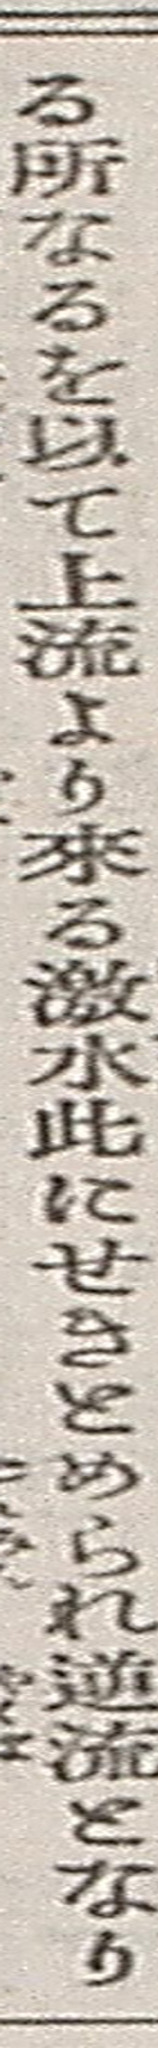る所なるを以て上流より来る激水此にせきとめられ逆流となり
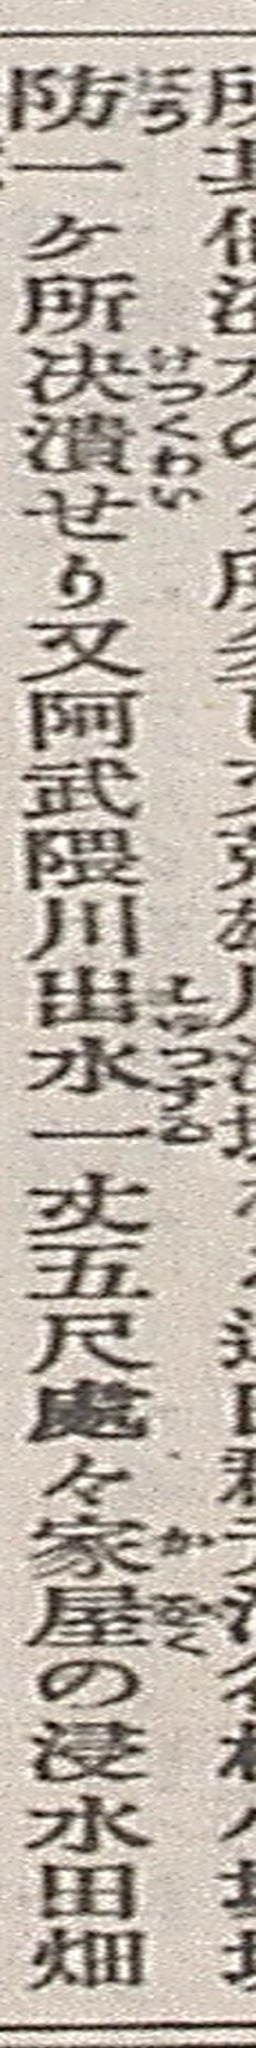防一ヶ所决潰せり又阿武隈川出水一丈五尺処々家屋の浸水田畑
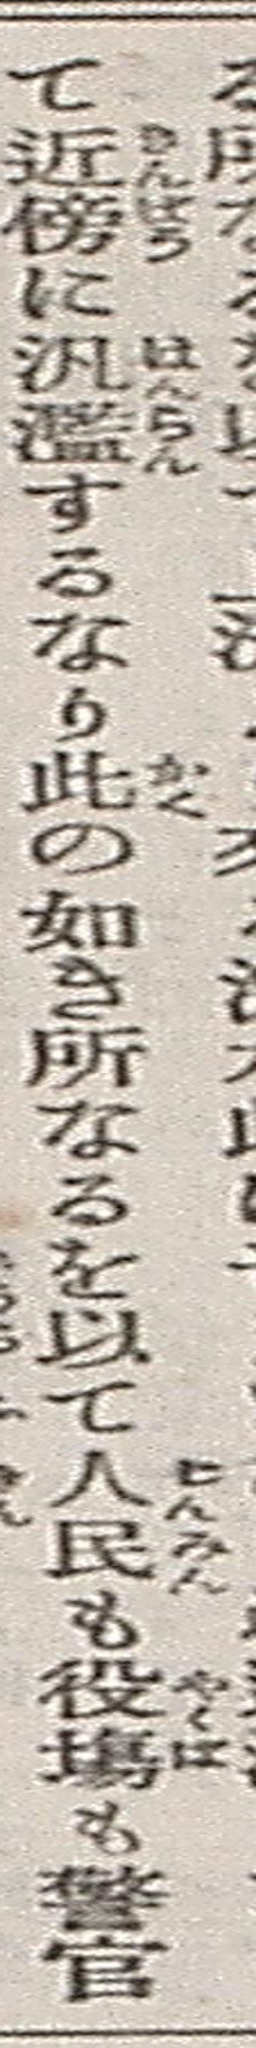て近傍に氾濫するなり此の如き所なるを以て人民も役場も警官
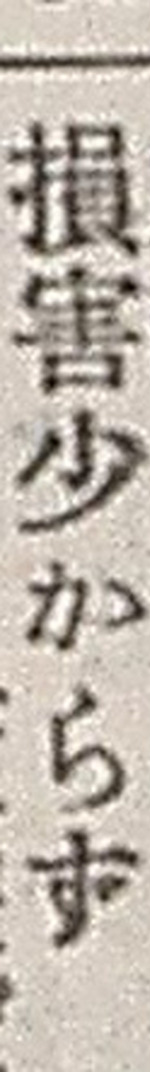損害少からず
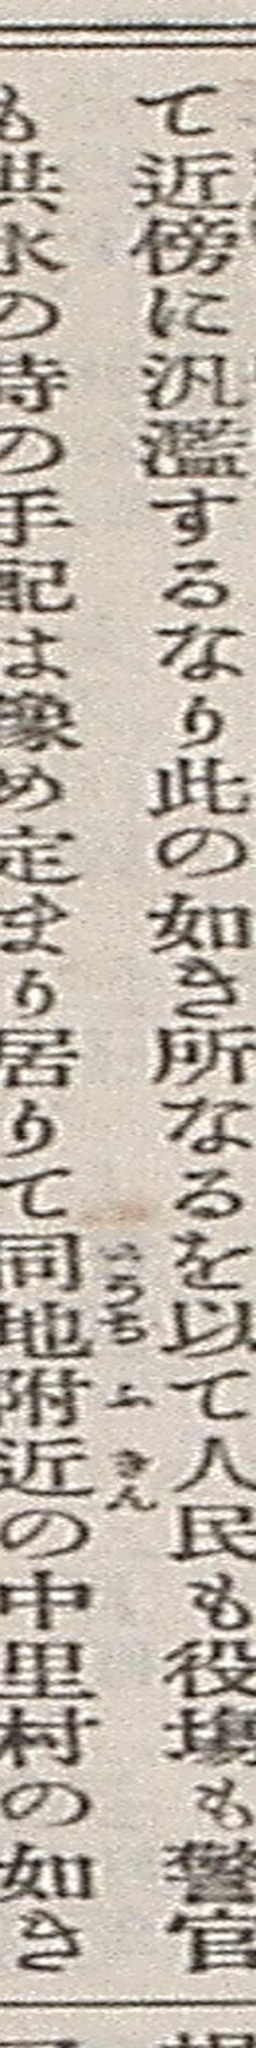も洪水の時の手配は予め定まり居りて同地附近の中里村の如き
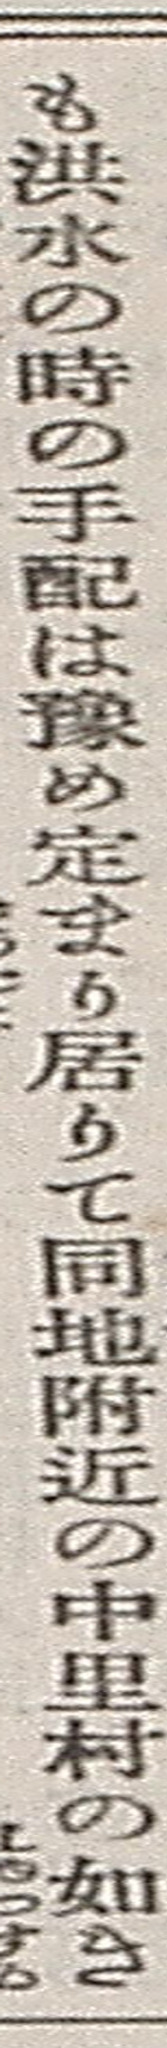も洪水の時の手配は予め定まり居りて同地附近の中里村の如き
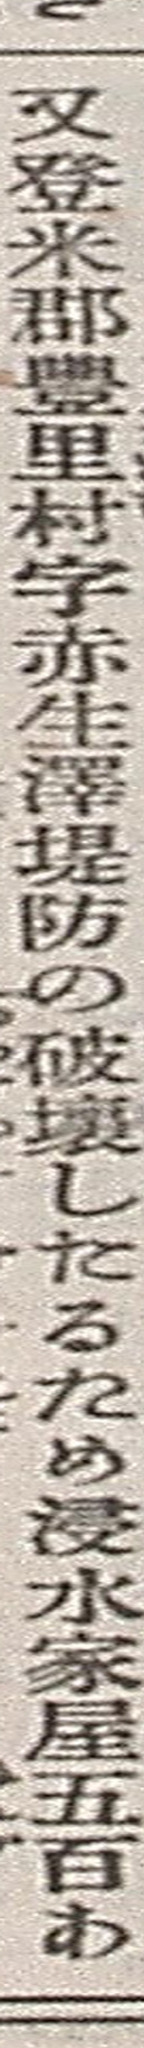又登米郡豊里村字赤生沢堤防の破壊したるため浸水家屋五百あ
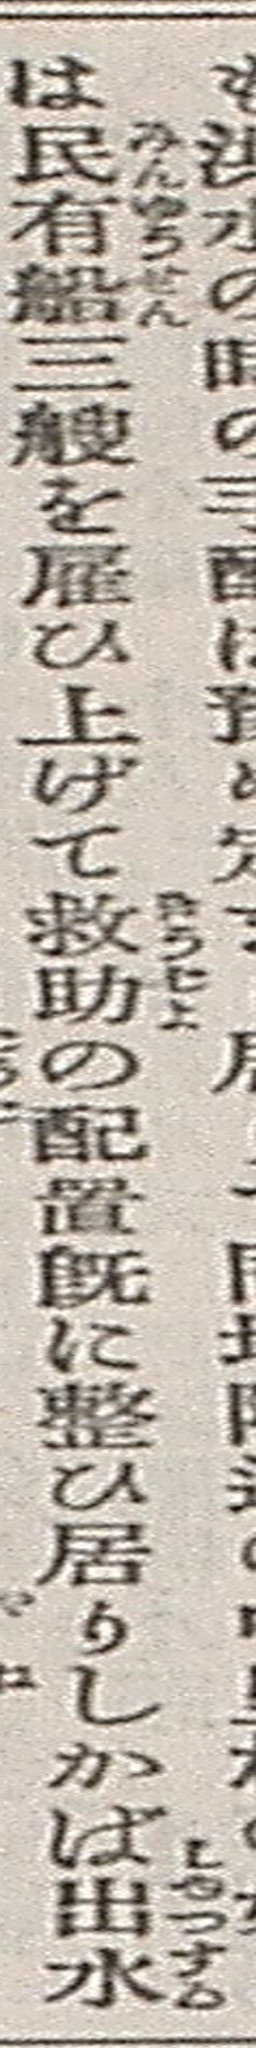は民有船三艘を雇ひ上げて救助の配置既に整ひ居りしかば出水
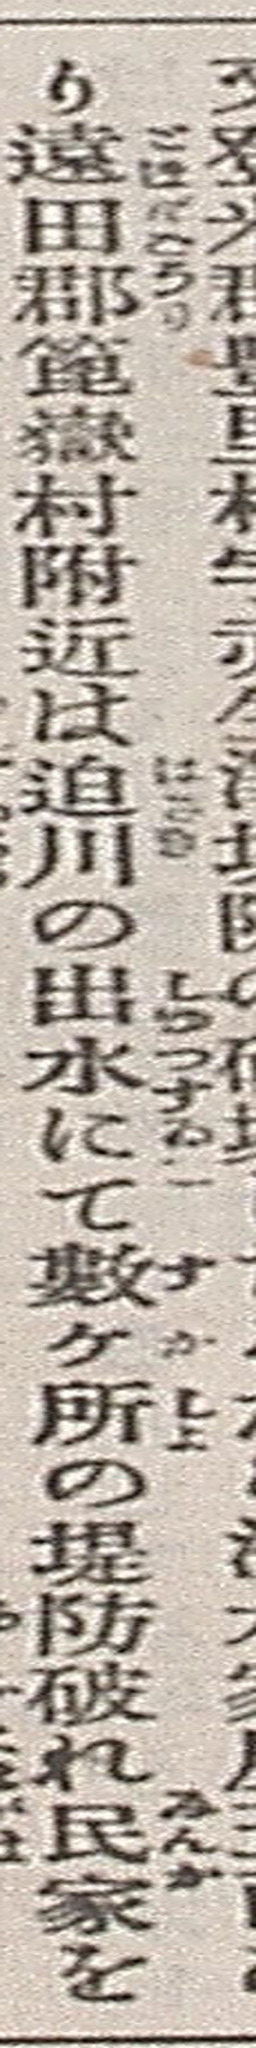り遠田郡箆嶽村附近は迫川の出水にて数ヶ所の堤防破れ民家を
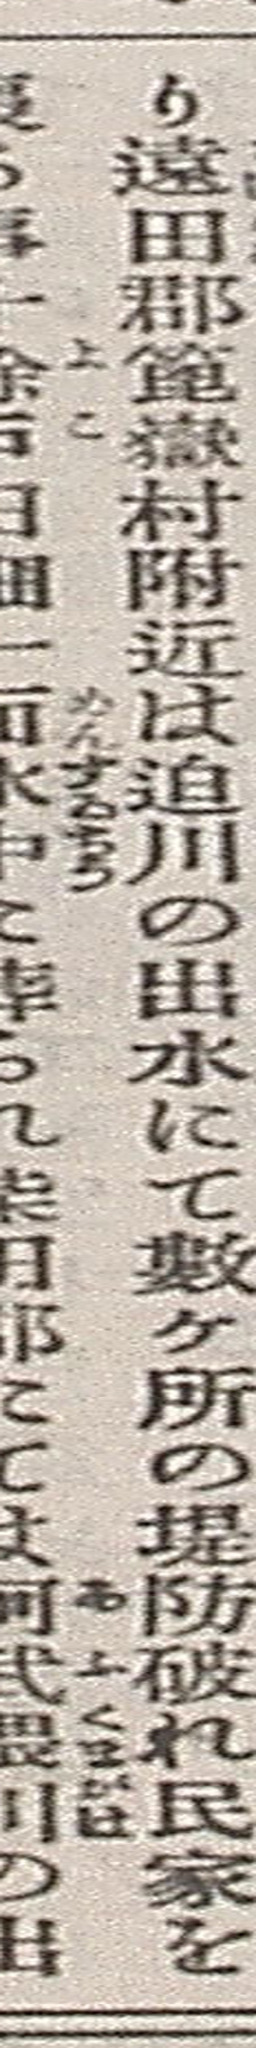壊る事十餘戸田畑一面水中に葬られ柴田郡にては阿武隈川の出
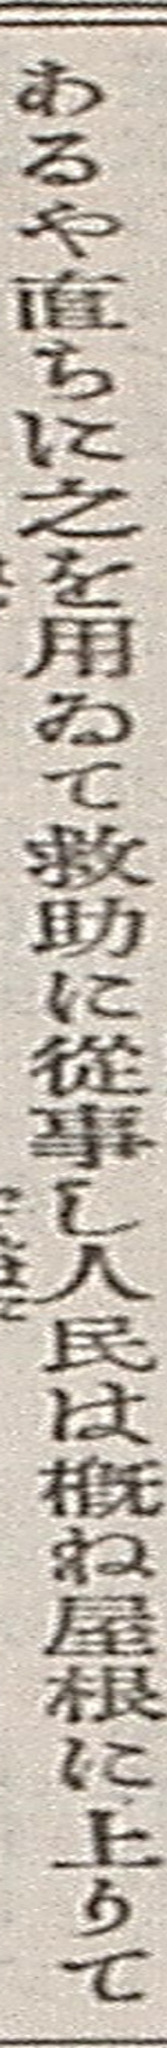あるや直ちに之を用ゐて救助に従事し人民は概ね屋根に上りて
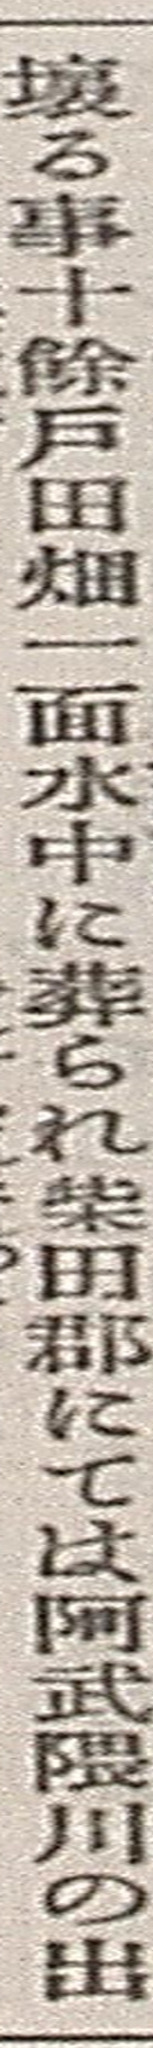壊る事十餘戸田畑一面水中に葬られ柴田郡にては阿武隈川の出
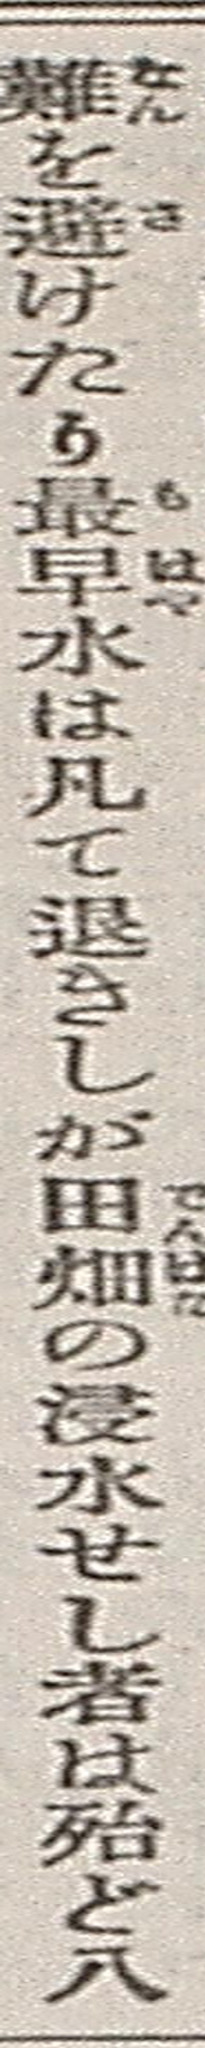難を避けたり最早水は凡て退きしが田畑の浸水せし者は殆ど八
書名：風俗畫報臨時増刊第百二十八號　洪水被害録（下）
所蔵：東京大学地震研究所図書室 Earthquake Research Institute Library, The University of Tokyo, JAPAN
